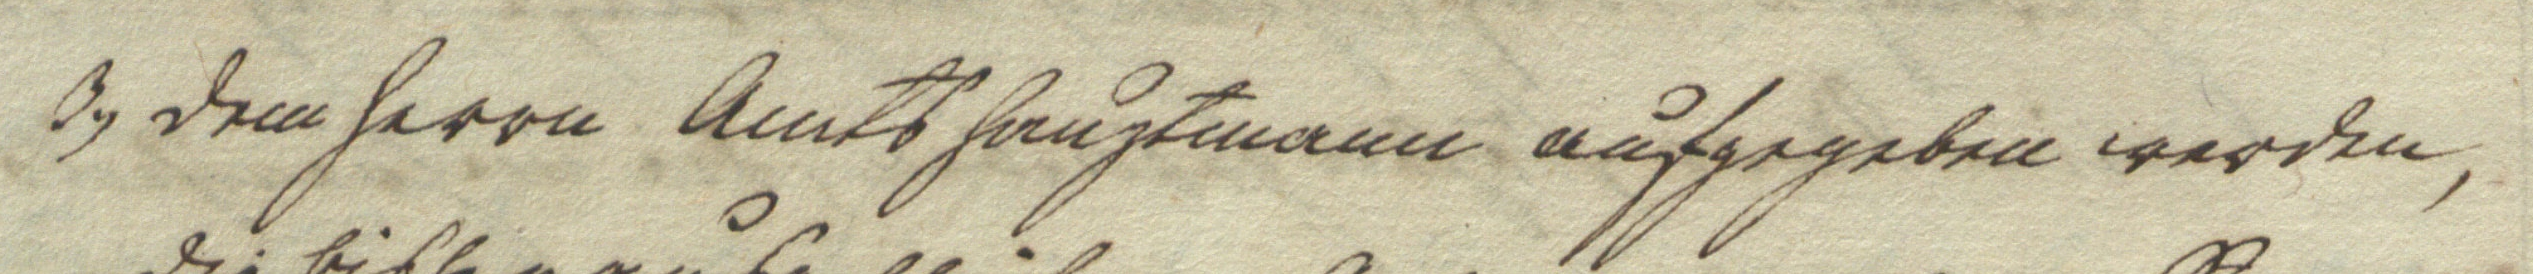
3. dem Herrn Amtshauptmann aufgegeben worden,
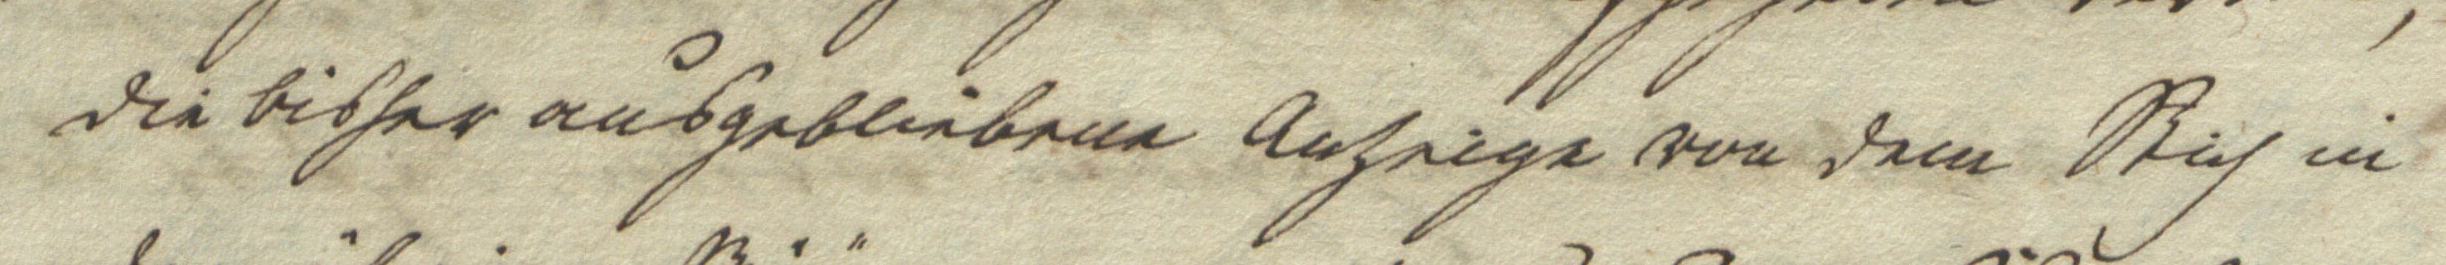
die bisher ausgebliebene Anzeige von dem Stich in
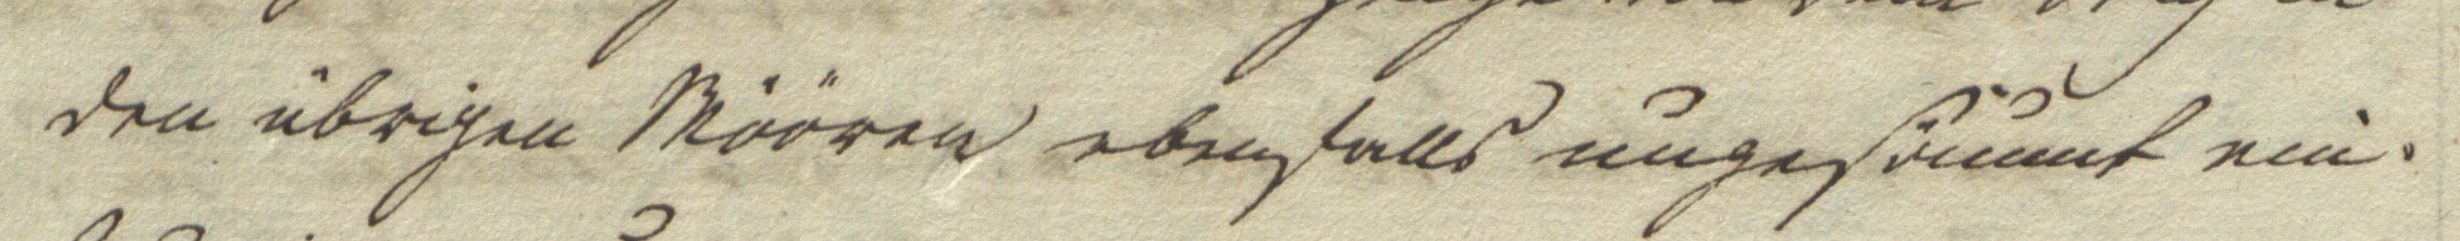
den übrigen Möören ebenfalls ungesäumt ein¬
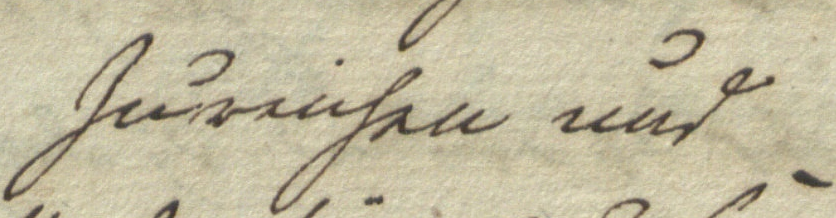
zureichen und
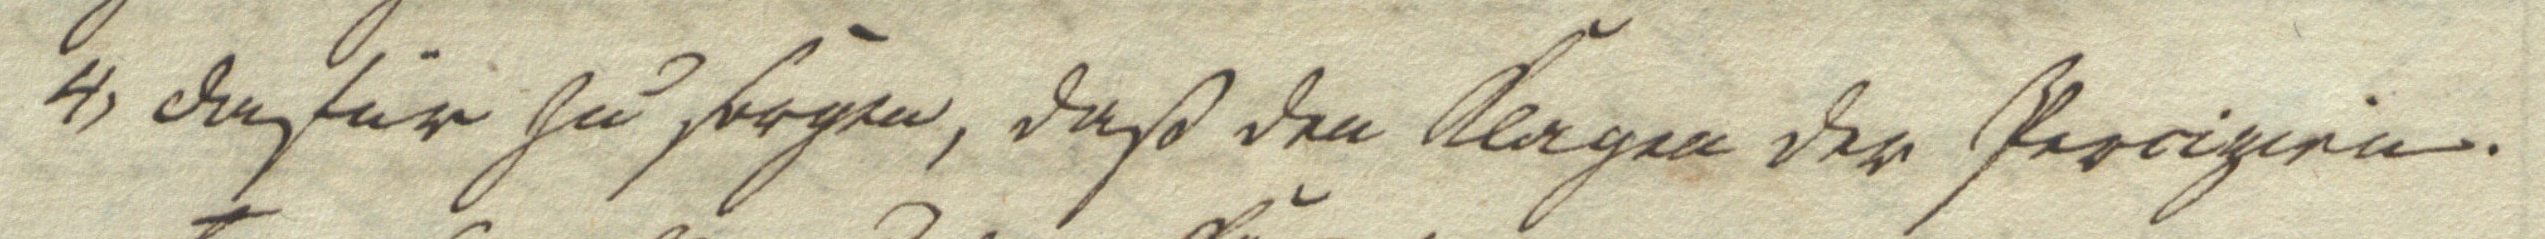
4, dafür zu sorgen, daß den Klagen der Percipien¬
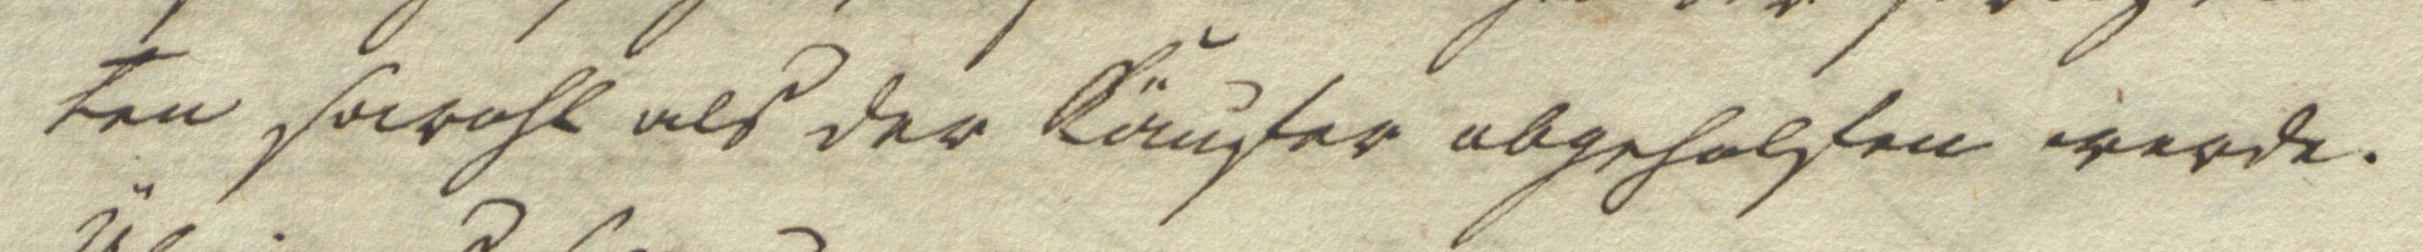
ten sowohl als der Käufer abgeholfen werde
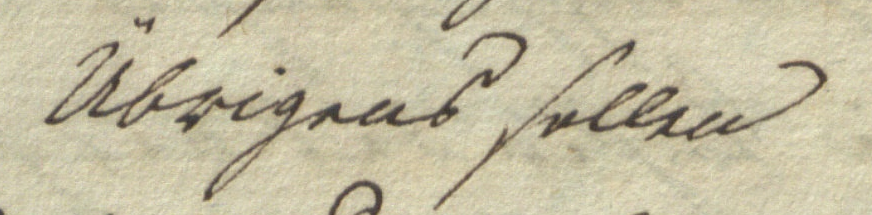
Übrigens sollen
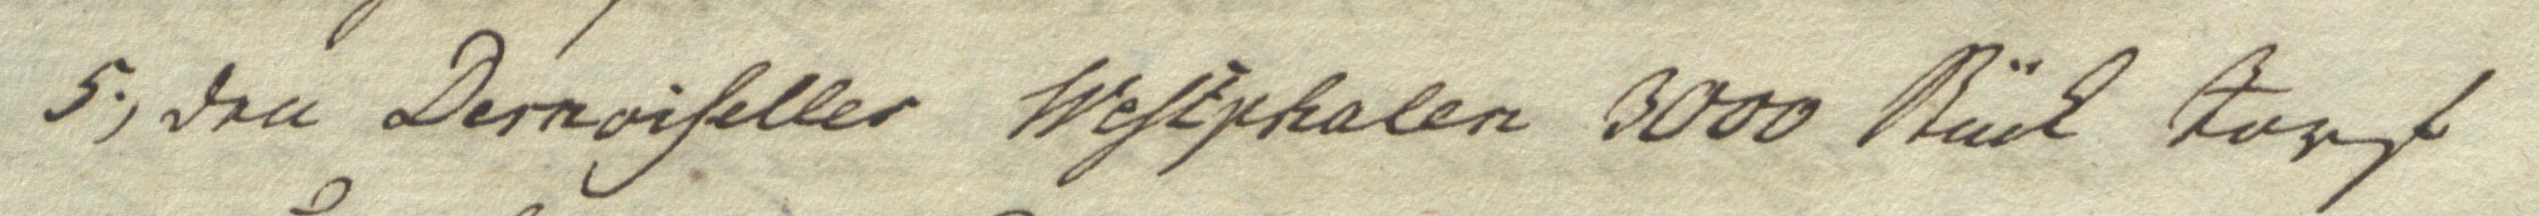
5., den Demoiselles Wetphalen 3000 Stück Torf
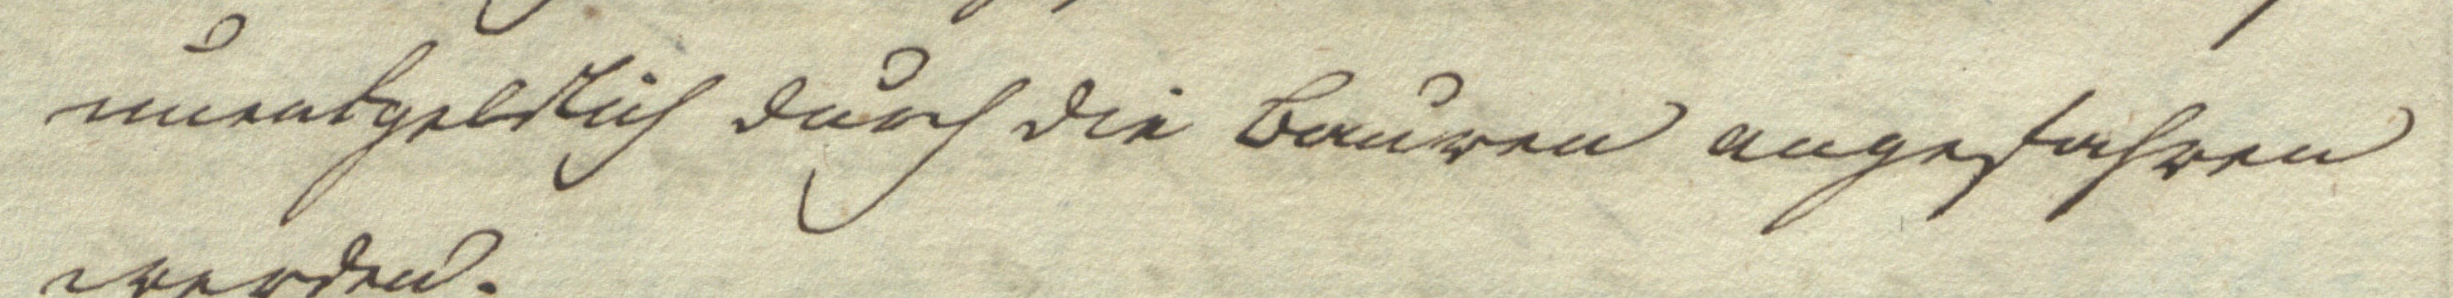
unentgeldlich durch die Bauren angefahren
